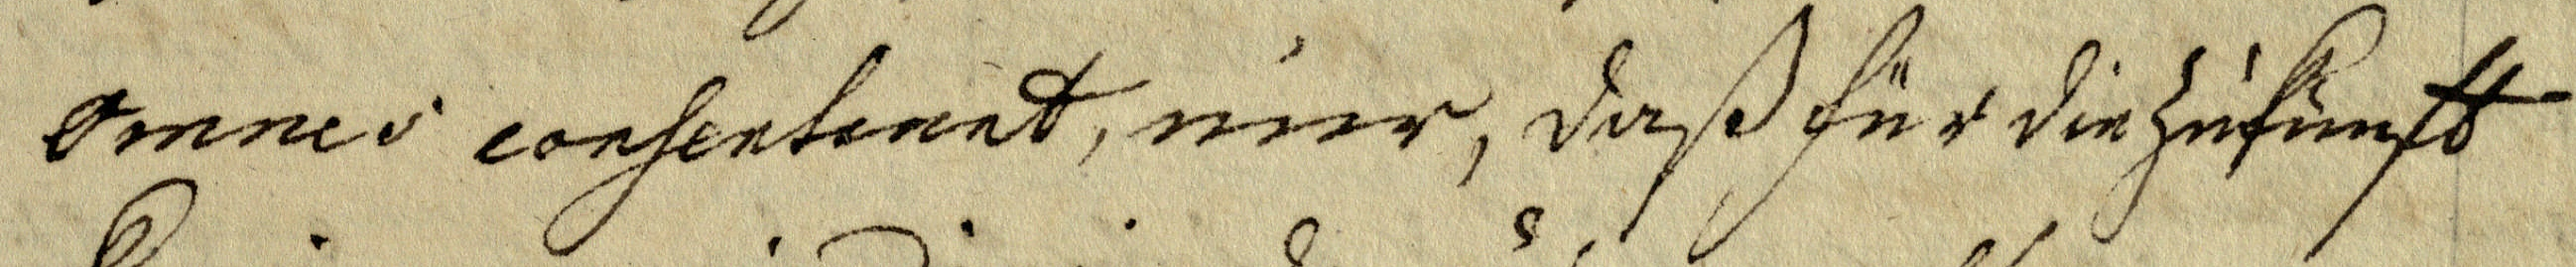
Omnes consentiunt, nur, daß für die Zukunft
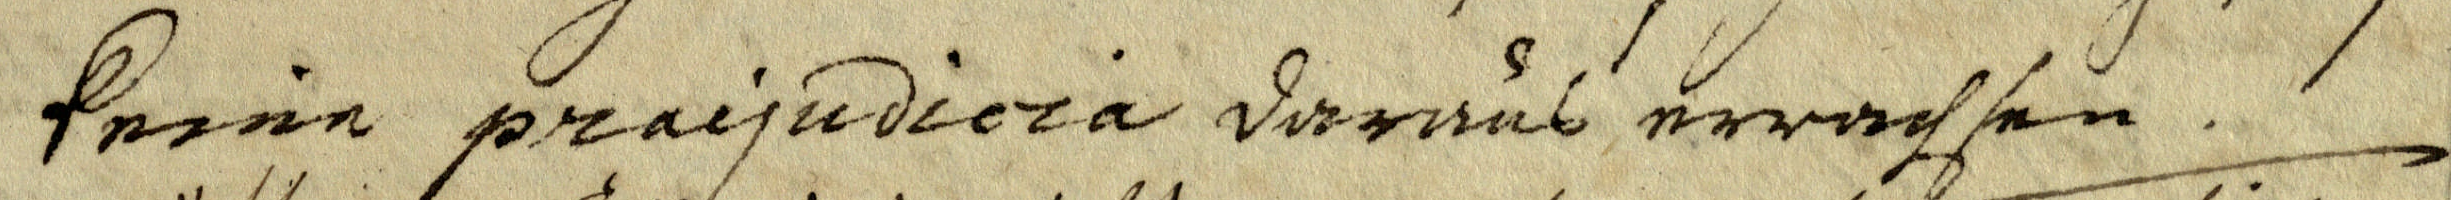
keine praejudicia daraus erwachsen.
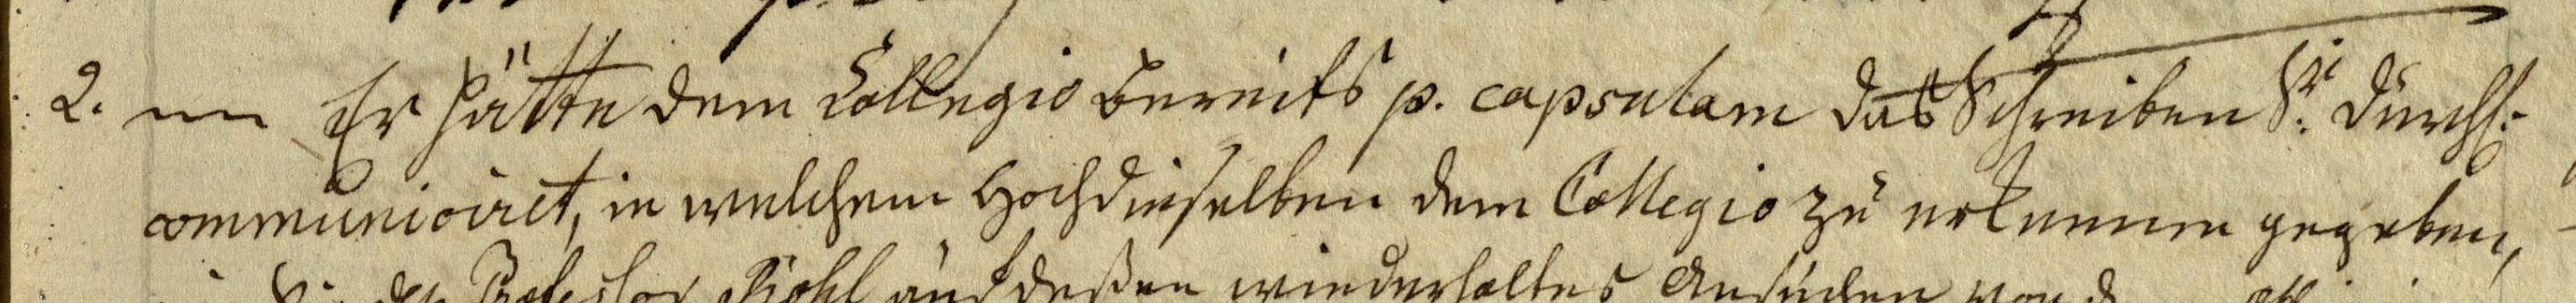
2. Er hätte dem Collegio bereits p. capsulam das Schreiben Sr Durchl.
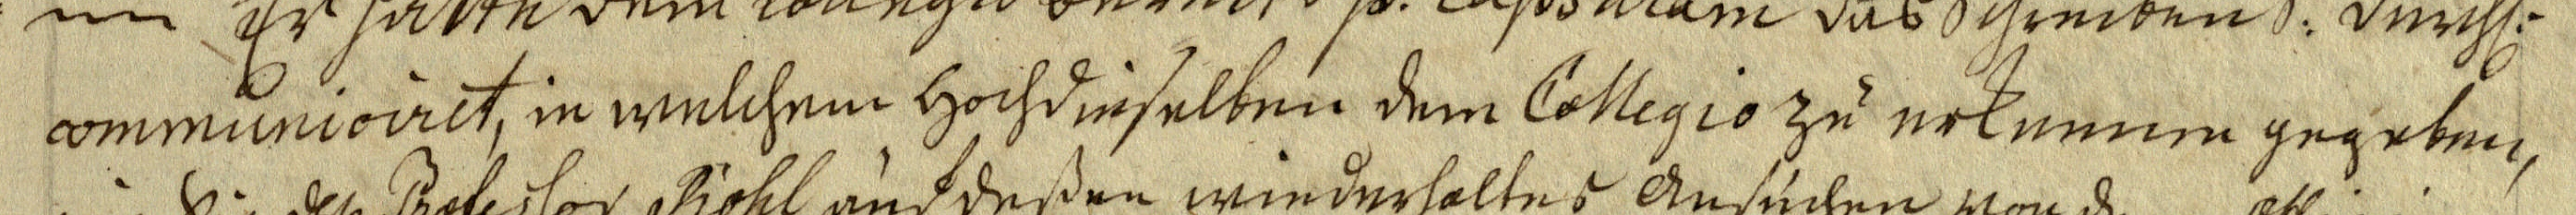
communiciret, in welchem Hochdieselben dem Collegio zu erkennen gegeben,
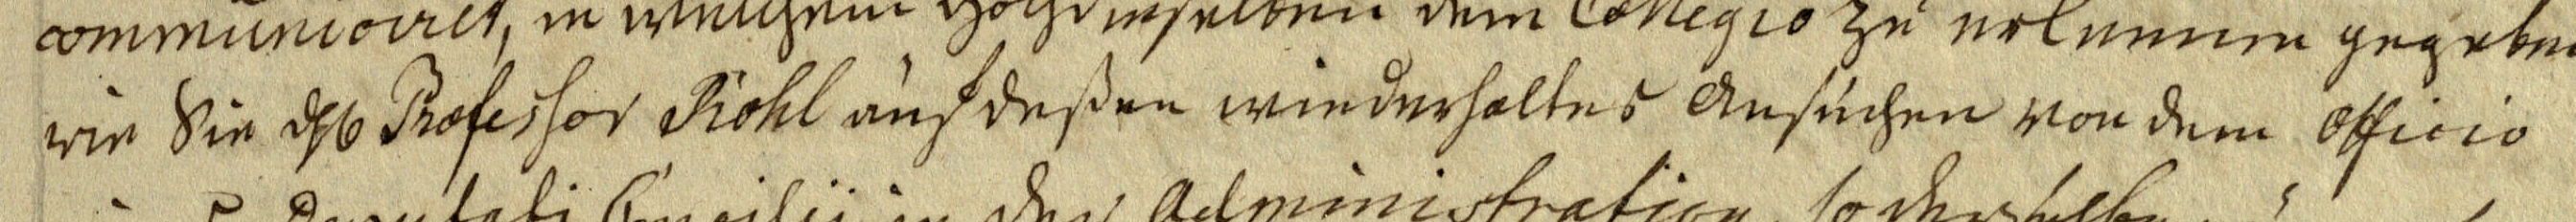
wie Sie dh Professor Röhl auf deßen wiedrholtes Ansuchen von dem officio
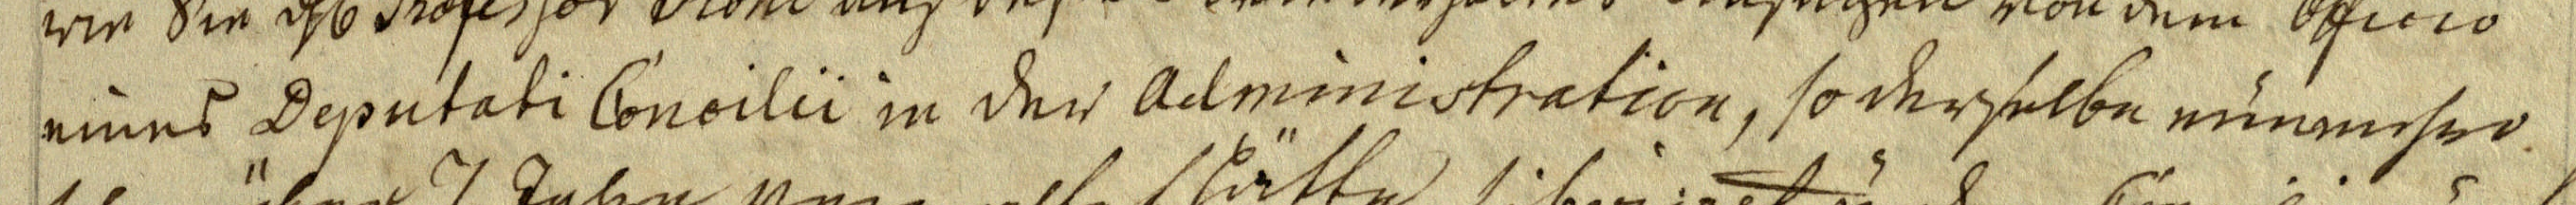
eines Deputati Concilii in der Administration, so derselbe nunmehro
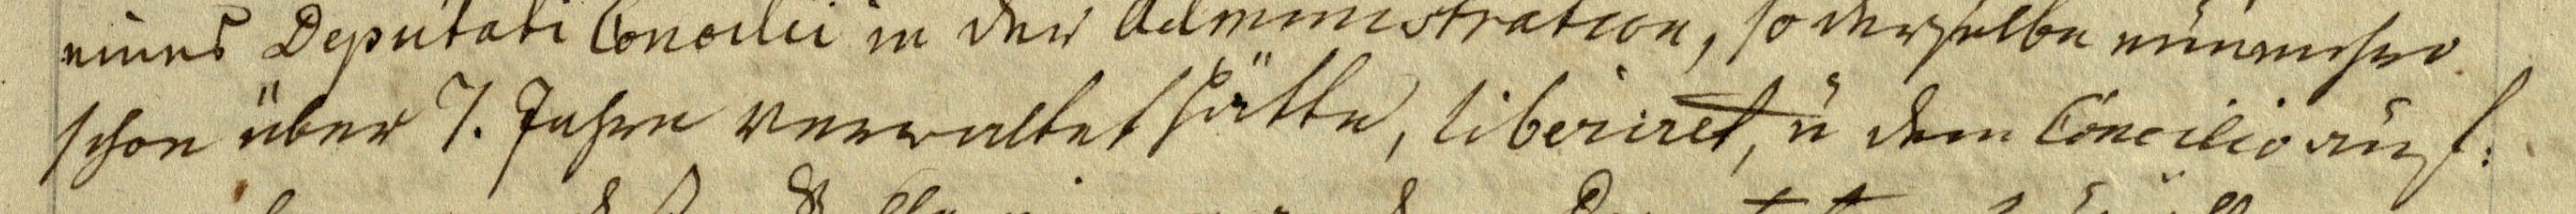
schon über 7. Jahre verwaltet hätte, liberiret, u dem Concilio auf¬
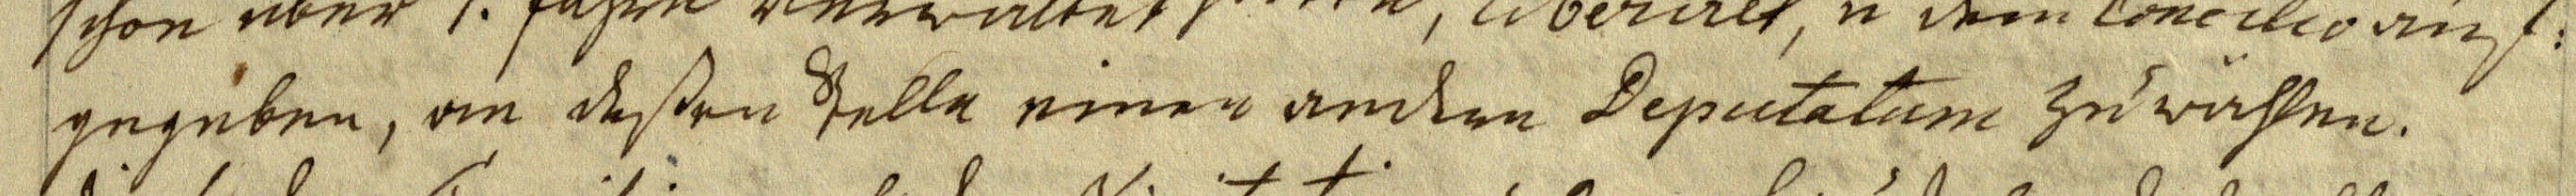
gegeben, an deßen Stelle einen andern Deputatum zu wählen.
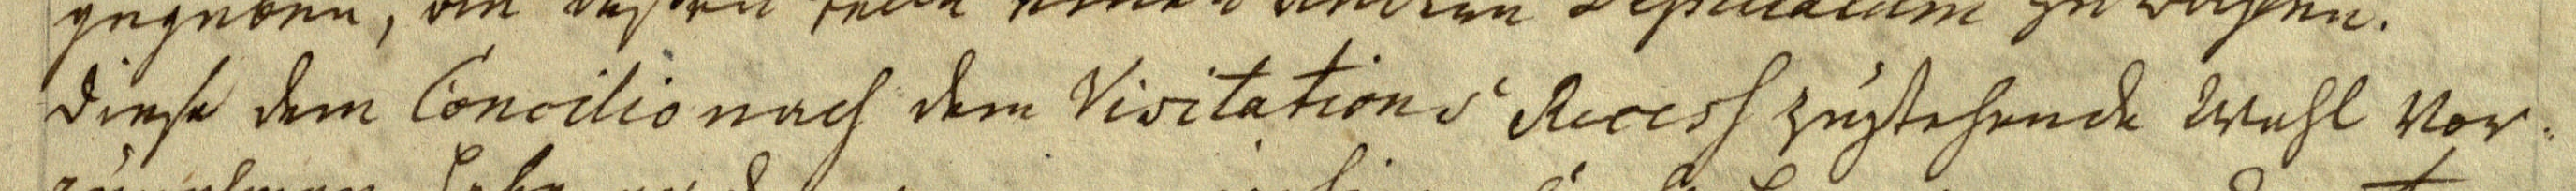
Diese dem Concilio nach dem Visitations Recess zustehende Wahl vor¬
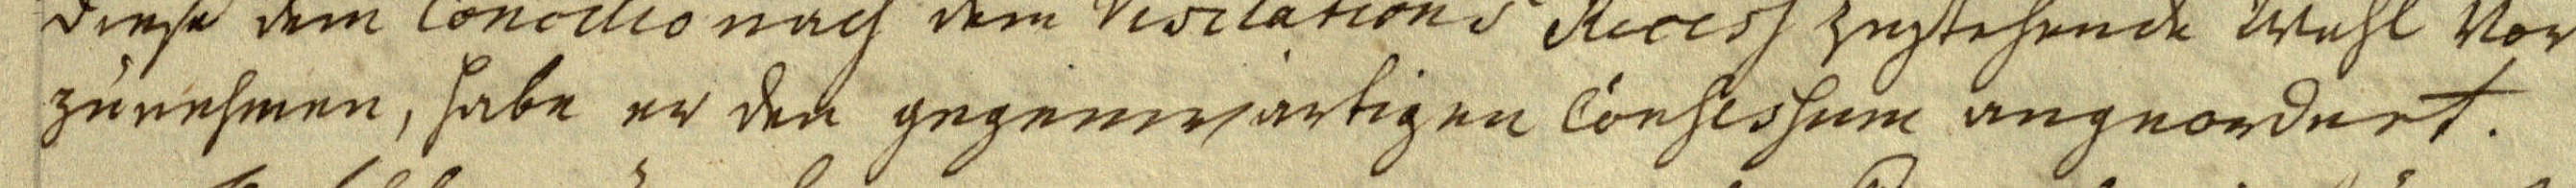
zunehmen, habe er den gegenwärtigen Consessum angeordnet.
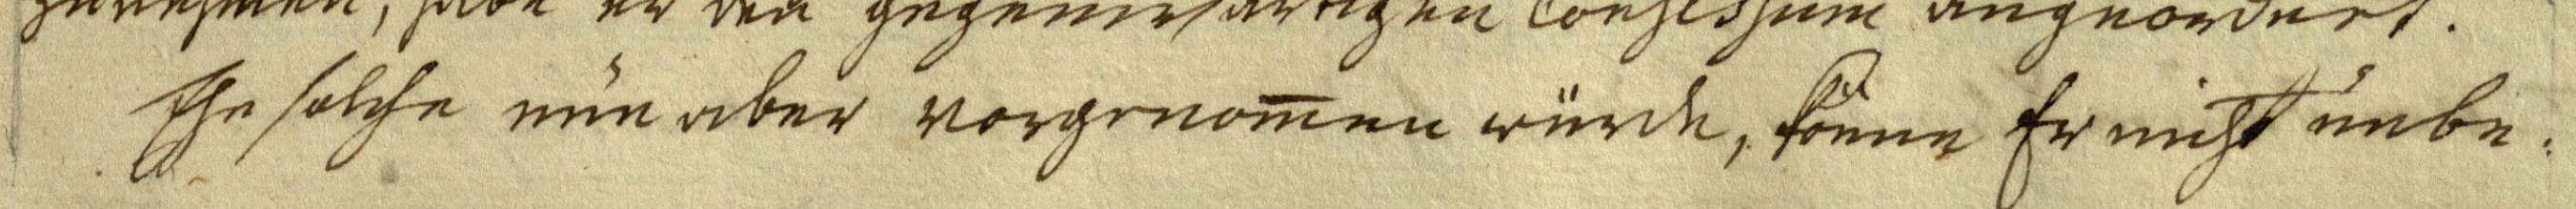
Ehe solche nun aber vorgenomen würde, könne Er nicht unbe
